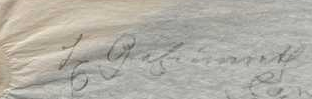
Zürich, den
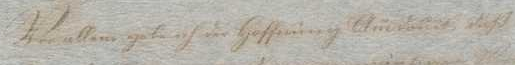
Vor allem gebe ich der Hoffnung Ausdruck, daß
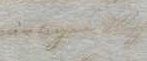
Sie nach den
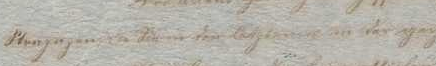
Strapazen, die Sie in der letzten & in der gegenwärtigen
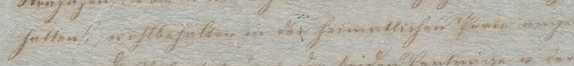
hatten, wohlbehalten in der heimatlichen Porte angekommen
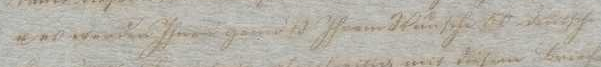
es werden Ihnen gemäß Ihrem Wunsche 50 deutsche
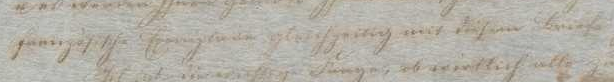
französische Exemplare gleichzeitig mit diesem Briefe
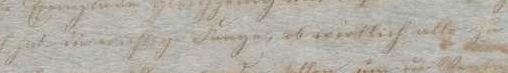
habe die wichtige Frage, ob wirklich alle zu
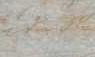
stehenden
